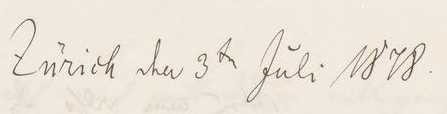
Zürich den 3ten Juli 1878
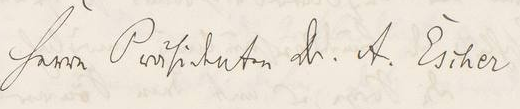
Herrn Präsidenten Dr. A. Escher
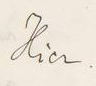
Hier.
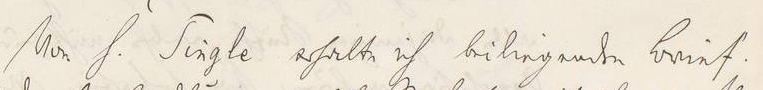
Von H. Single erhalte ich beiliegenden Brief.
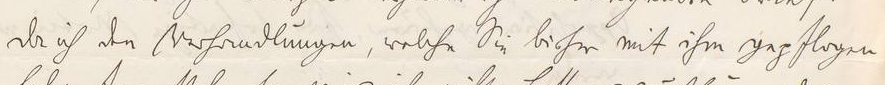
Da ich den Verhandlungen, welche Sie bisher mit ihm gepflogen
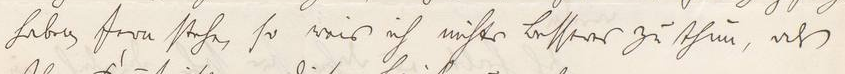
haben, fern stehe, so weis ich nichts Besseres zu thun, als
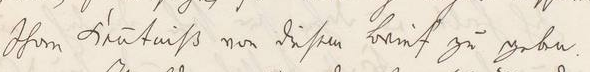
Ihnen Kenntniß von diesem Brief zu geben.
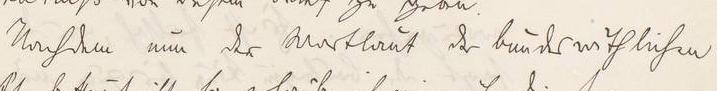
Nachdem nun der Wortlaut der bundesräthlichen
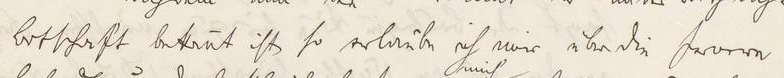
Botschaft bekannt ist, so erlaube ich mir über die fernere
